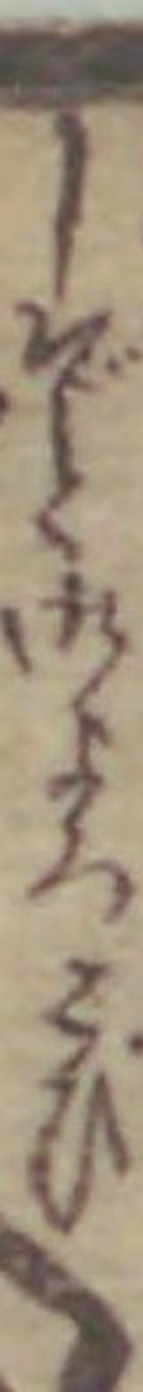しぞと御よろこび
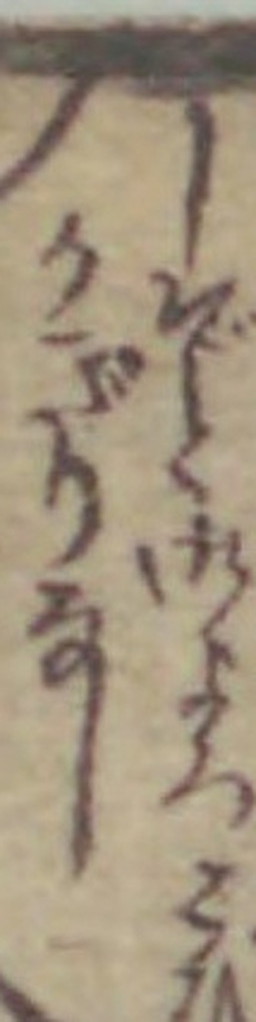かぎりなし
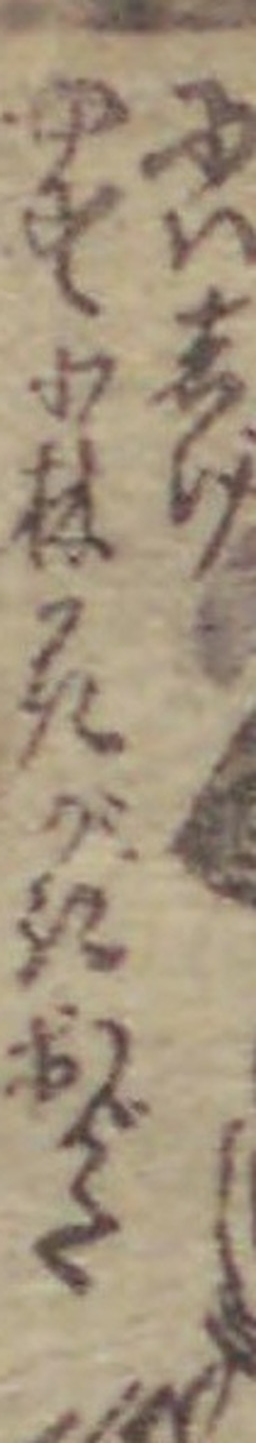やす小林花がきおがた
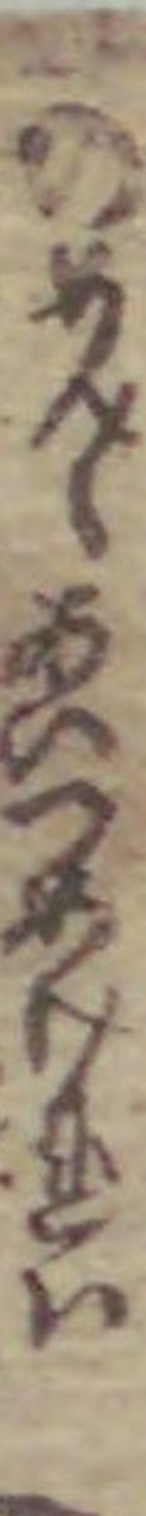のめん〳〵あいつめけれは
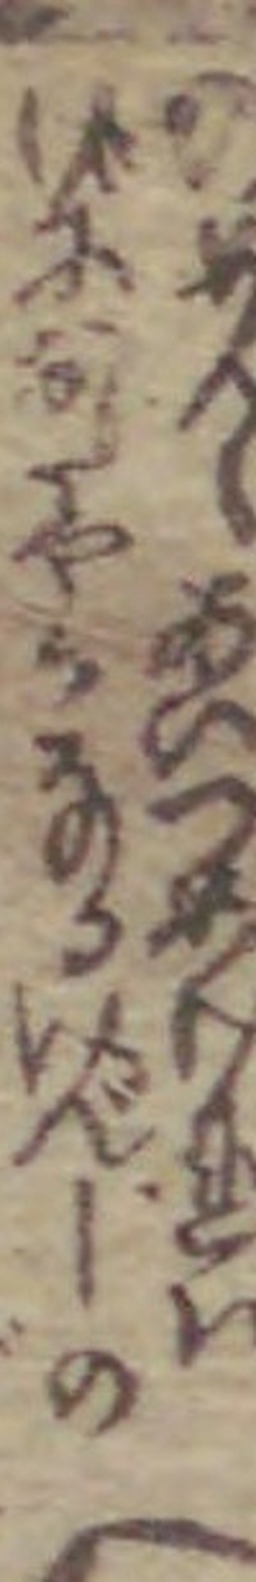げにおたやかなるげんじの
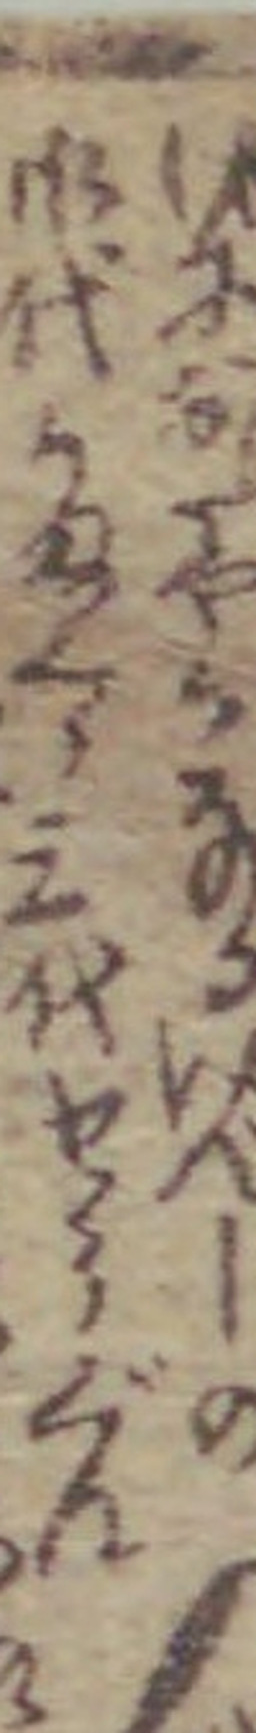御代かまくら三代せうぐん
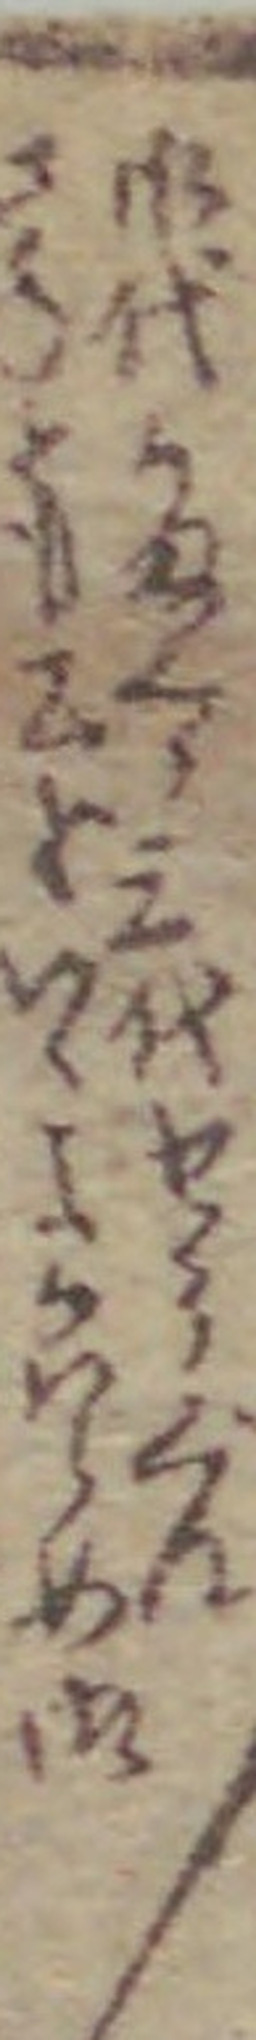さねとも公といくよかはらめ御

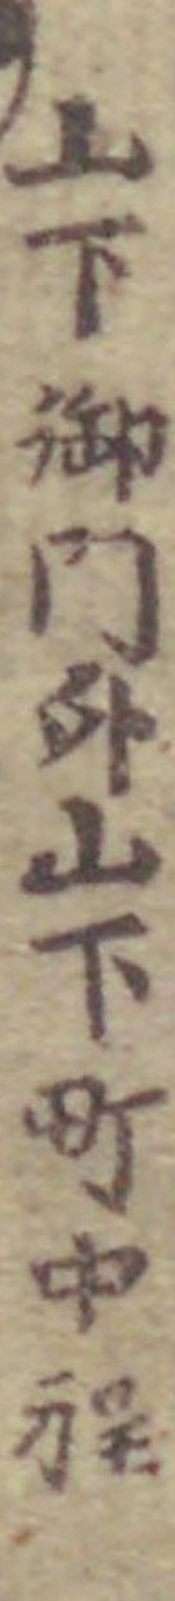山下御門外山下町中程
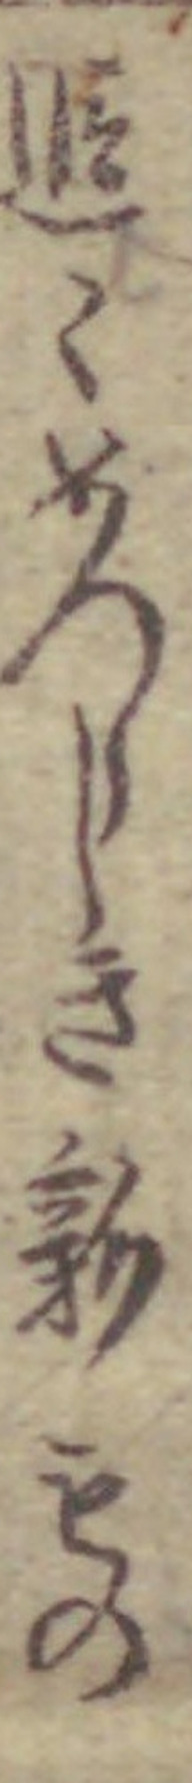追々めつらしき新もの
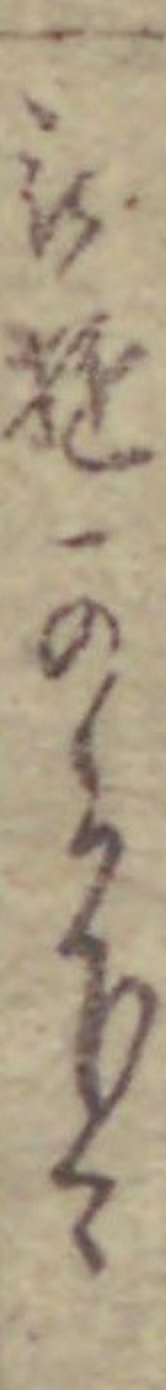被遊可被下候
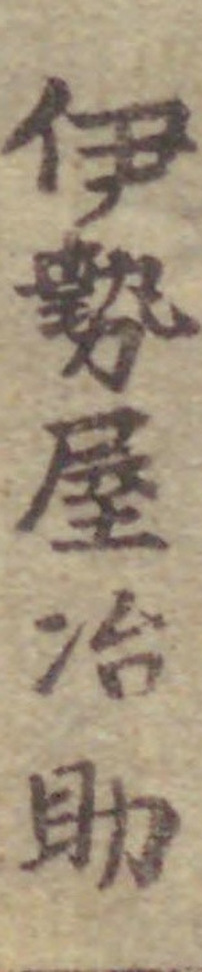伊勢屋冶助
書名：鎌倉山紅葉浮名
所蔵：国立国会図書館 National Diet Library, JAPAN
